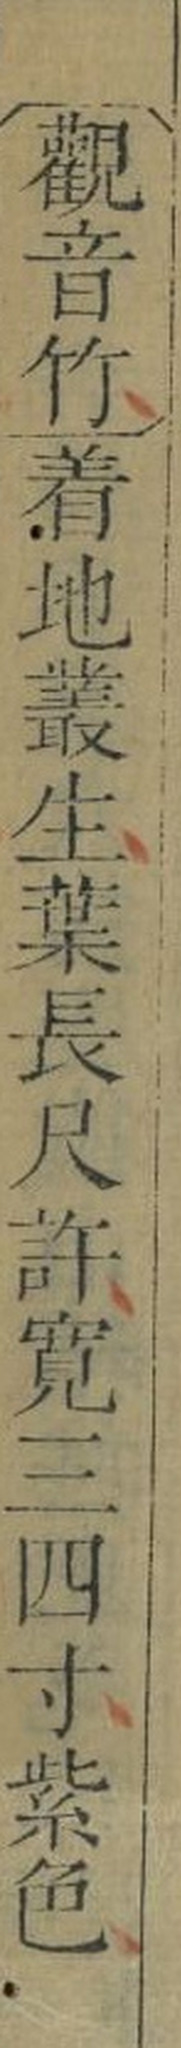[観音竹]着地叢生葉長尺許寛三四寸紫色

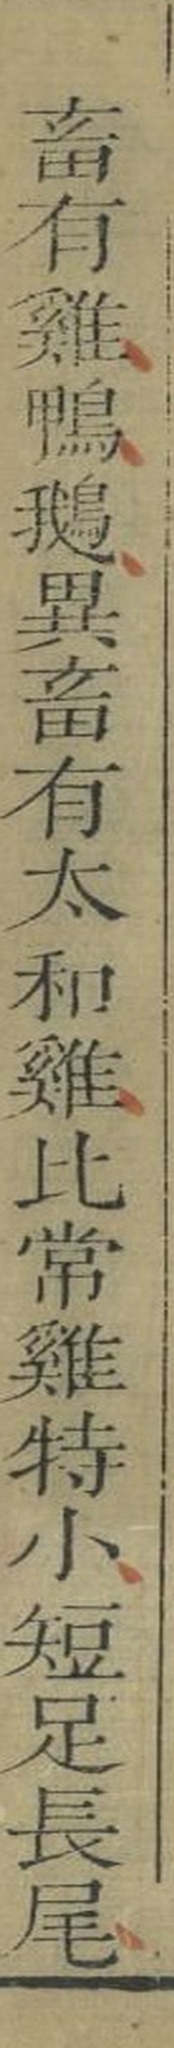畜有鶏鴨鵝異畜有太和鶏比常鶏特小短足長尾
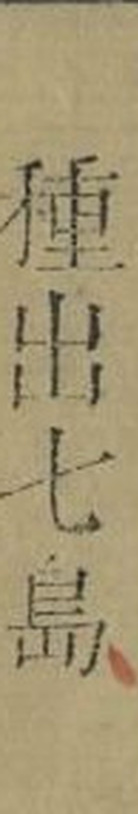種出七島
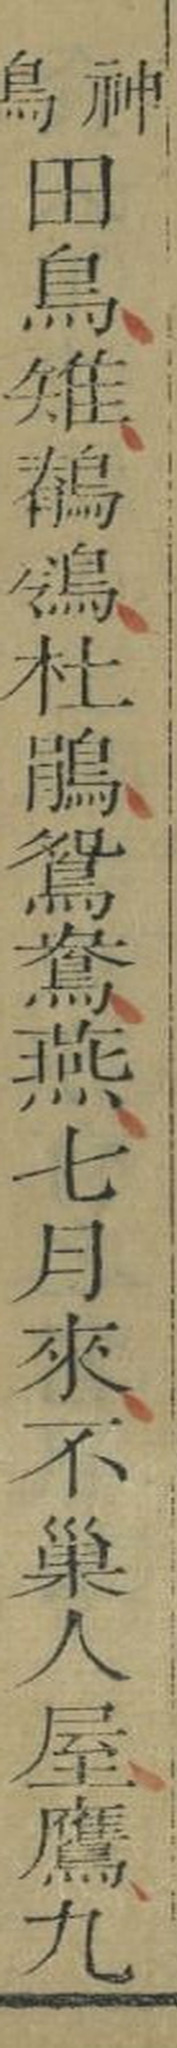神鳥田鳥雉鶺鴒杜鵑鴛鴦燕七月来不巣人屋鷹九
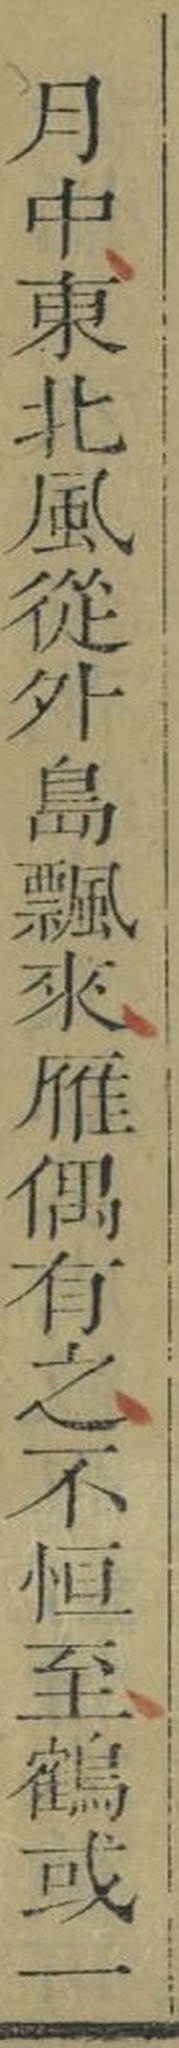月中東北風従外島飄来雁偶有之不恒至鶴或一
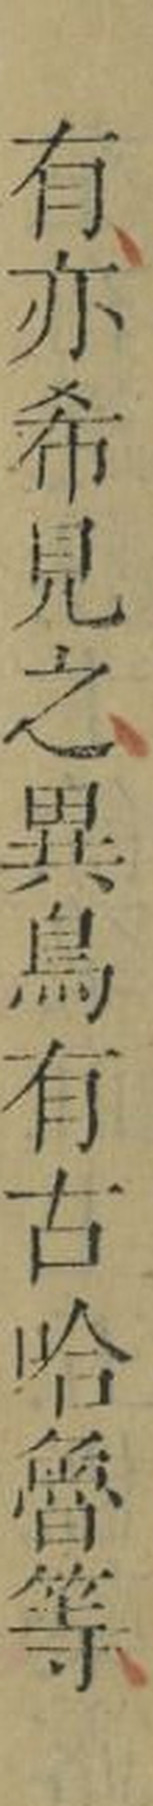有亦希見之異鳥有古哈魯等
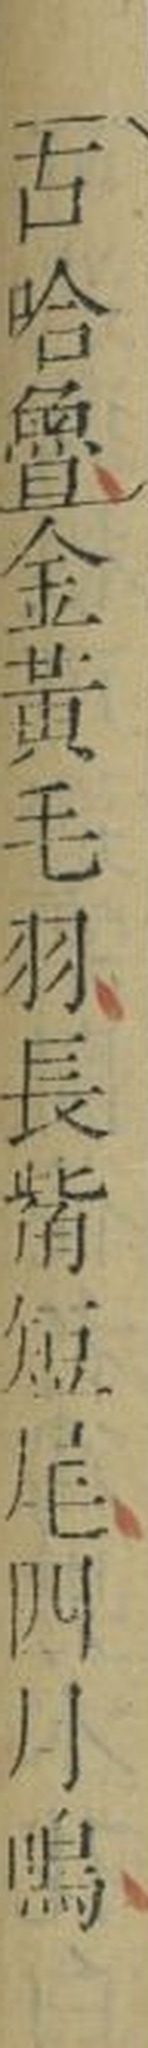[古哈魯]金黄毛羽長觜短尾四月鳴
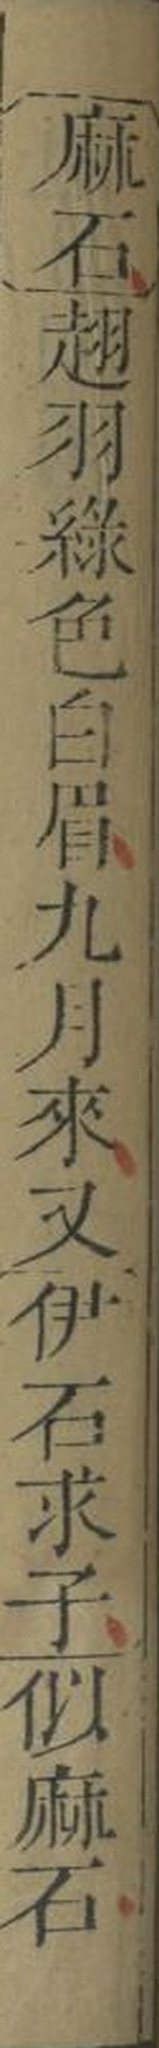[麻石]趐羽緑色白眉九月来又[伊石求子]似麻石
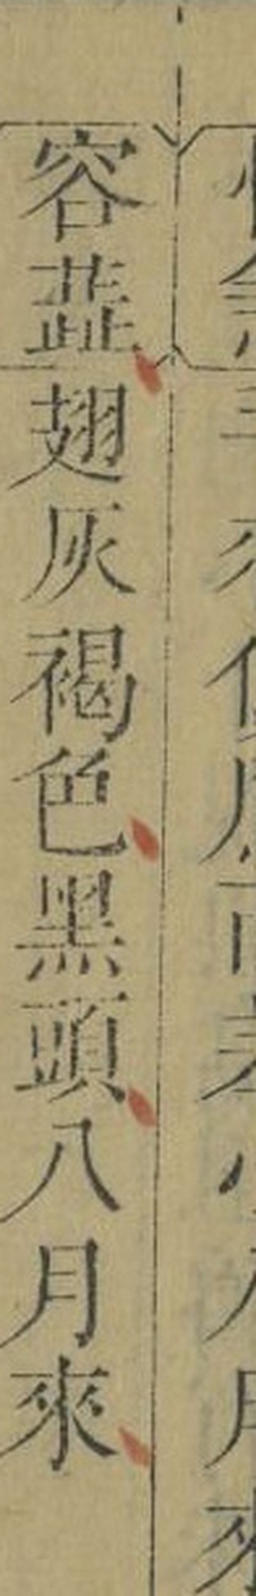[容蕋]翅灰褐色黒頭八月来
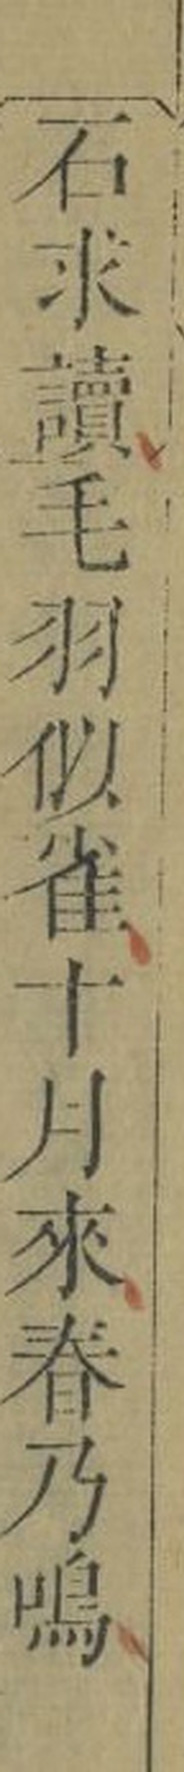[石求読]毛羽似雀十月来春乃鳴
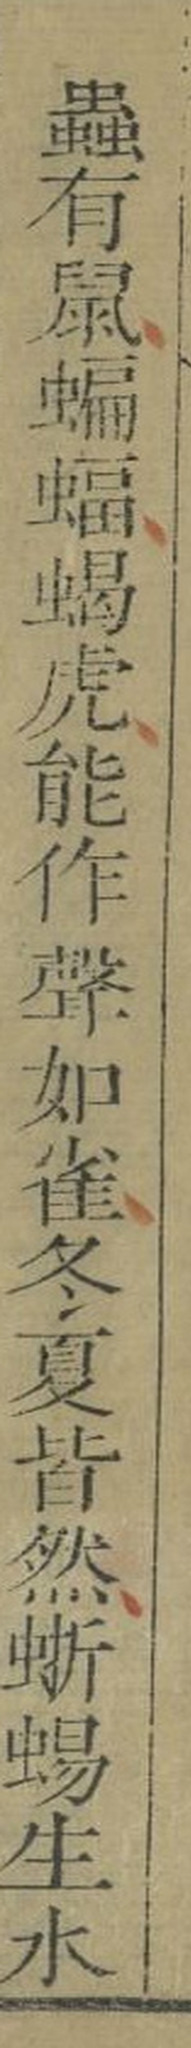虫有鼠蝙蝠蝎虎能作声如雀冬夏皆然蜥蜴生水
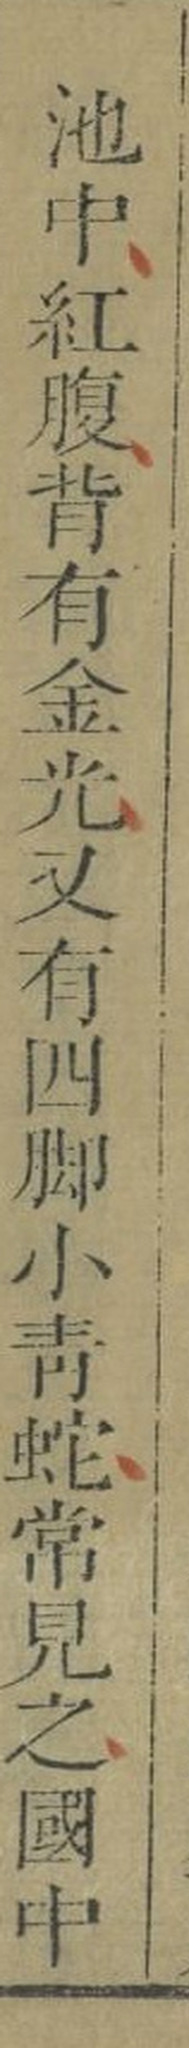池中紅腹背有金光又有四脚小青蛇常見之国中

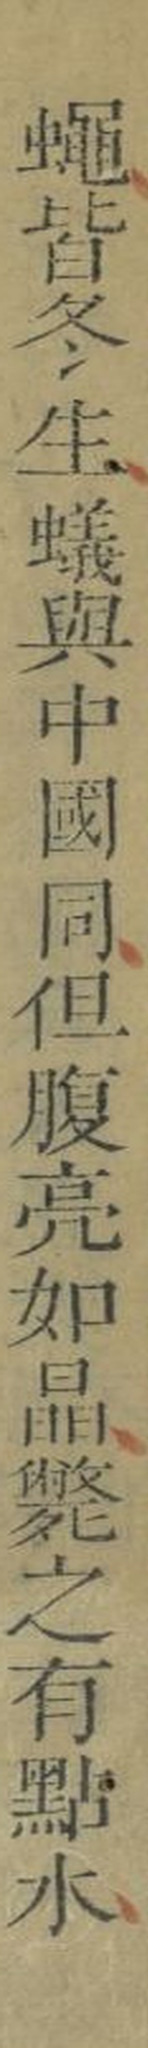蠅皆冬生蟻与中国同但腹亮如晶斃之有点水
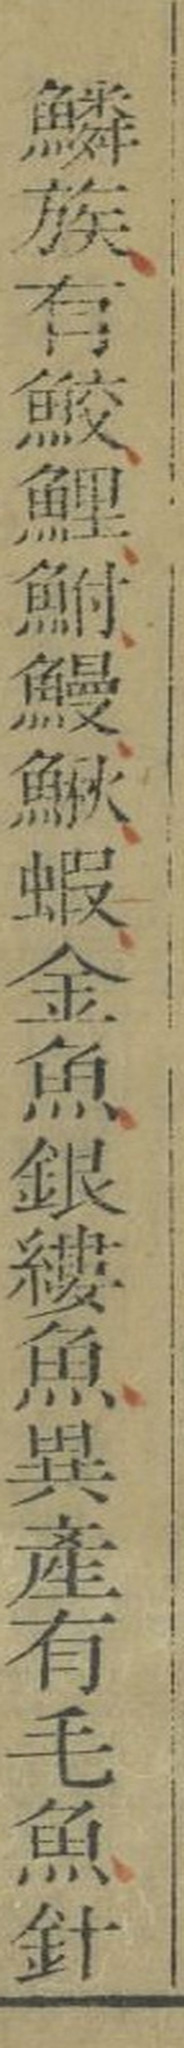鱗族有鮫鯉鮒鰻鰍蝦金魚銀縷魚異産有毛魚針
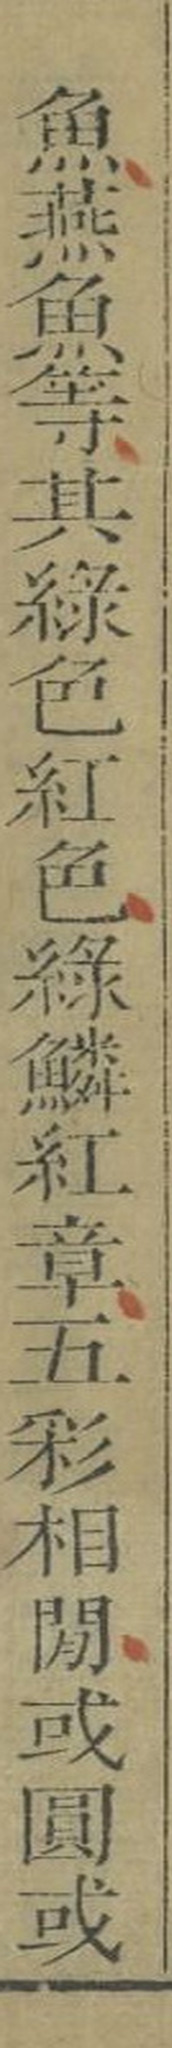魚燕魚等其緑色紅色緑鱗紅章五彩相間或円或
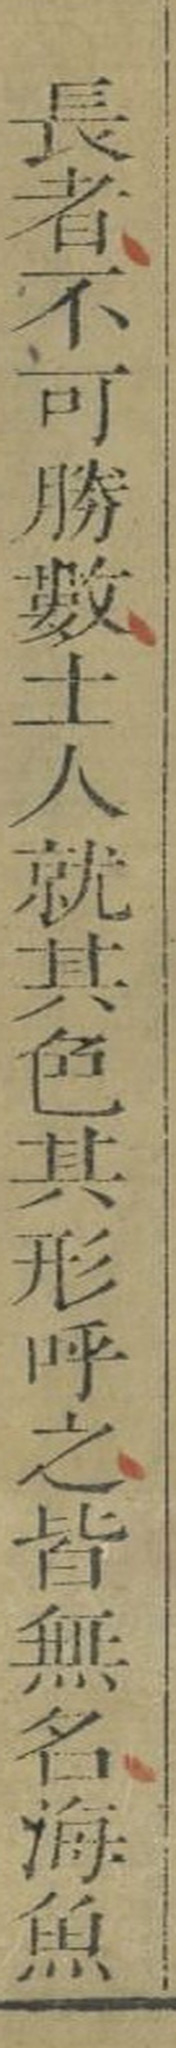長者不可勝数土人就其色其形呼之皆無名海魚
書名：中山伝信録 巻六
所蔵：University of the Ryukyus Library
